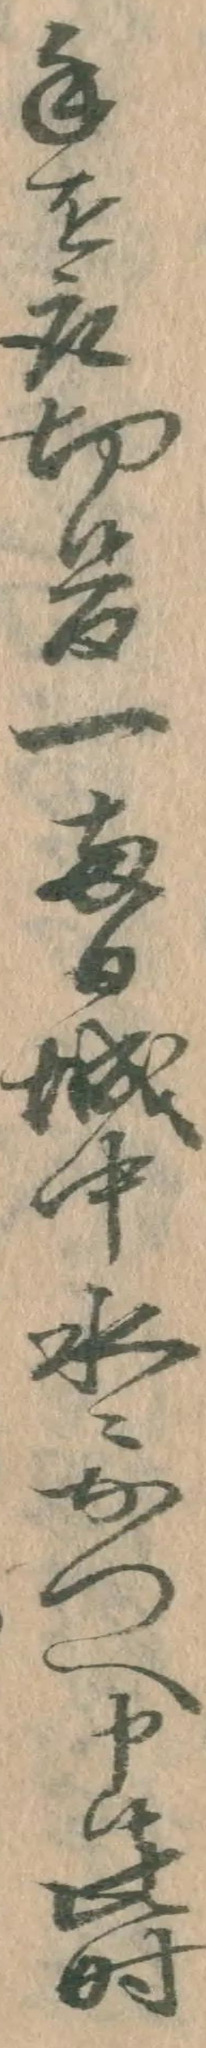手を取切候間一両日城中水にかつへ申候此時
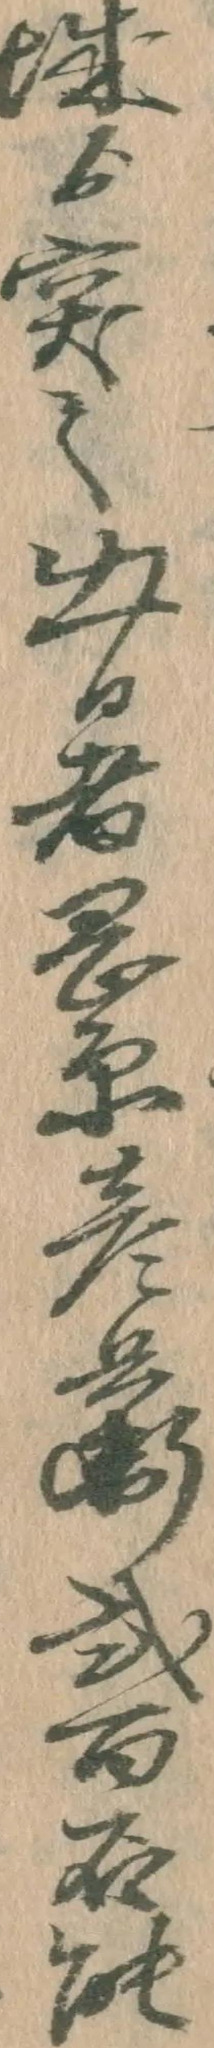城ゟ突て出る者岡原彦兵衛弐百石能
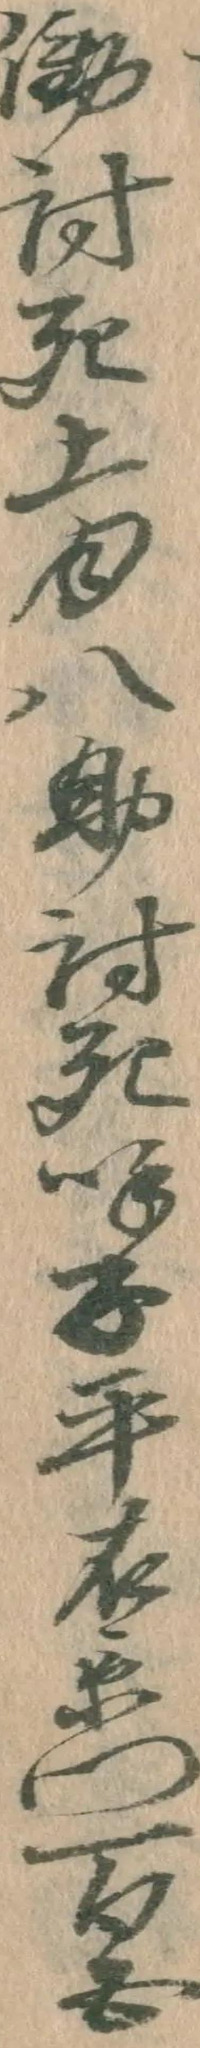働討死上月八助討死呼子平右衛門百五
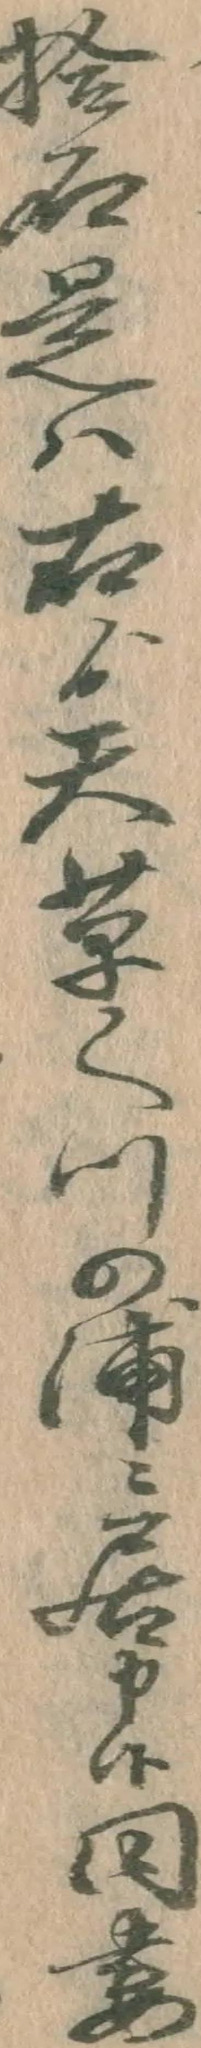拾石是は古ゟ天草くつの浦に居申候同妻
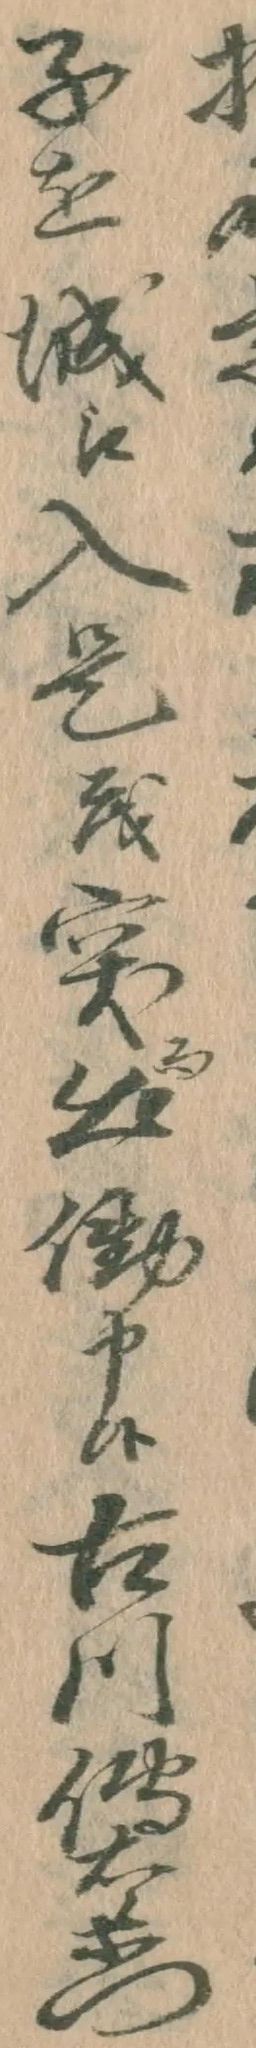子を城江入是も突而出働申候古川伝右衛門
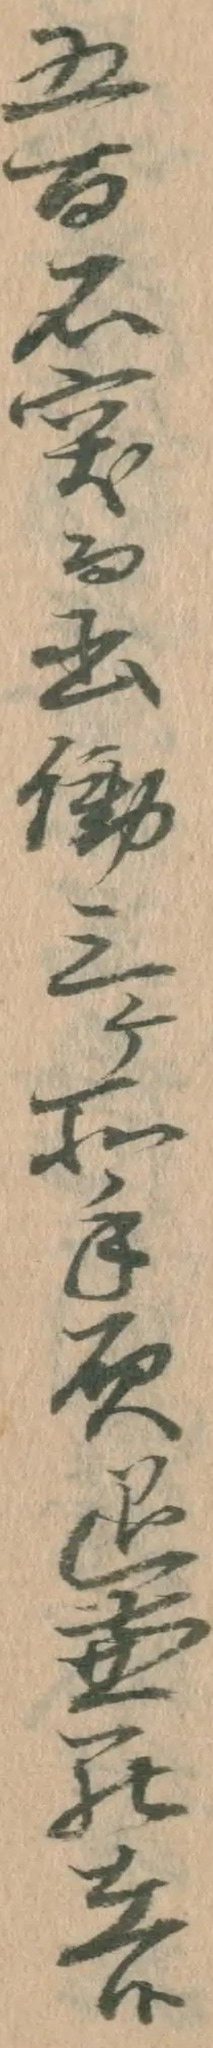五百石突而出働三ヶ所手負退兼罷在候
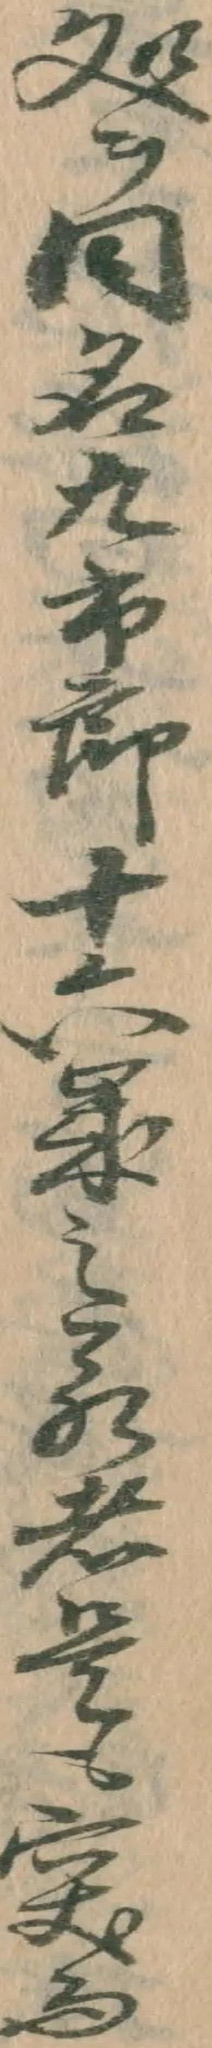処ヲ同名九市郎十六歳之若者是も突而
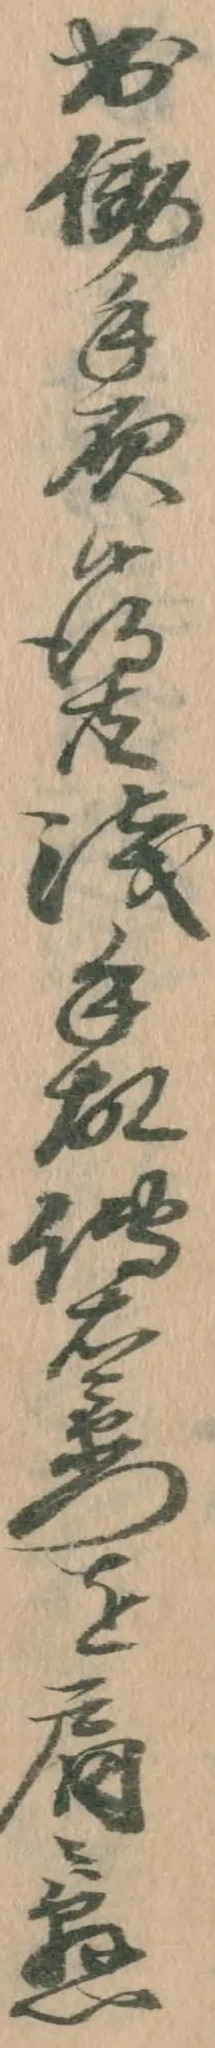出働手負候得共浅手故伝右衛門を肩に懸
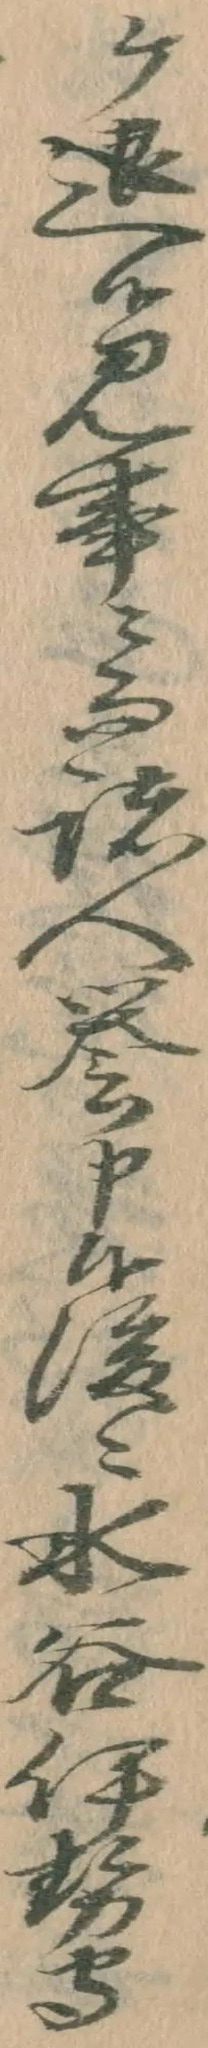ケ退候見事に而諸人誉申候後に水谷伊勢守
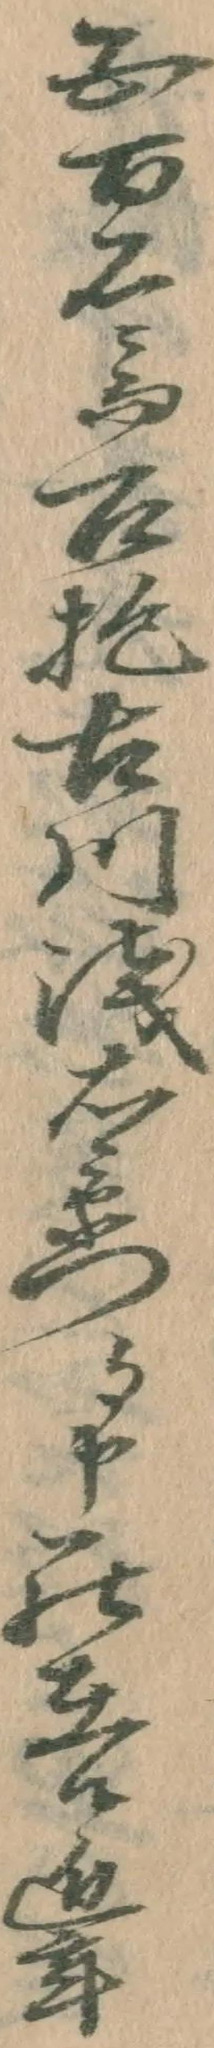五百石に而召抱古川浅右衛門と申罷在候近年
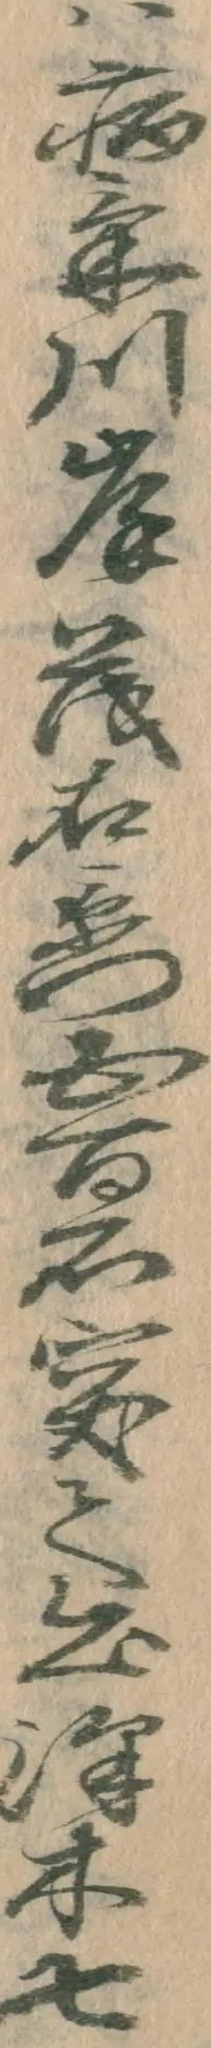は病気川岸茂右衛門五百石突て出沢木七
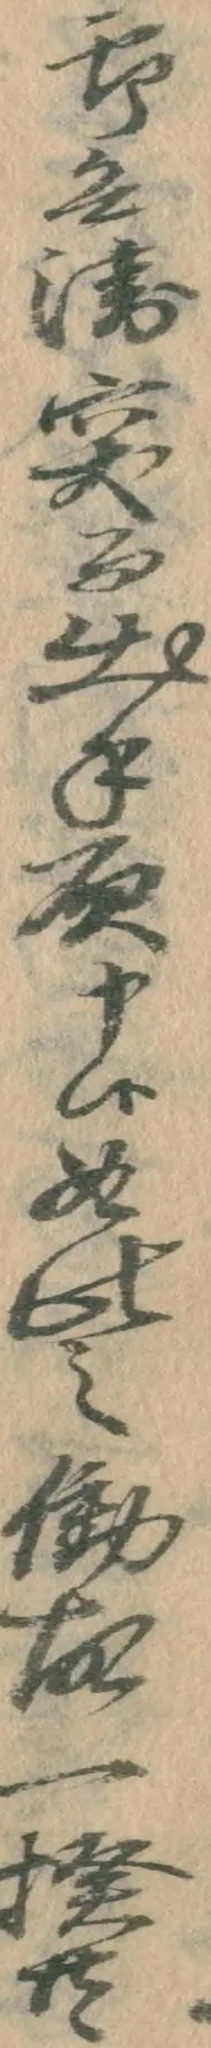郎兵衛突而出手負申候如此之働故一揆共
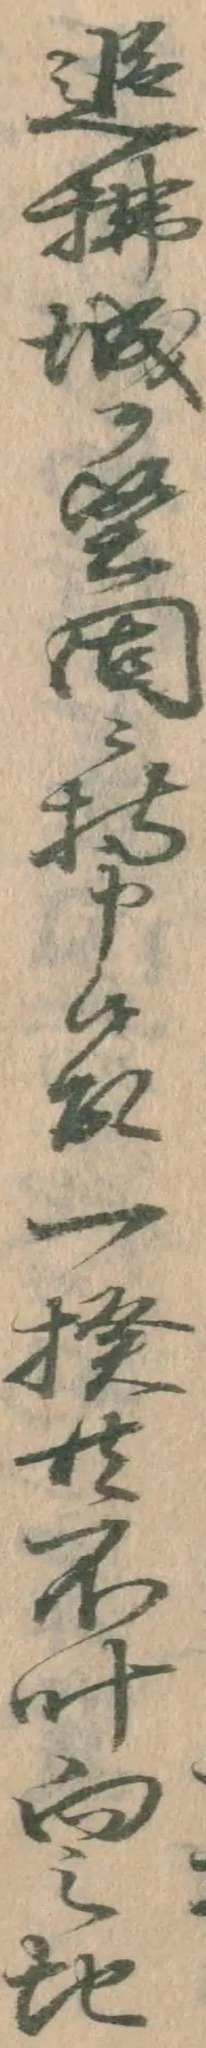退払城ヲ堅固に持申候故一揆共不叶向之地
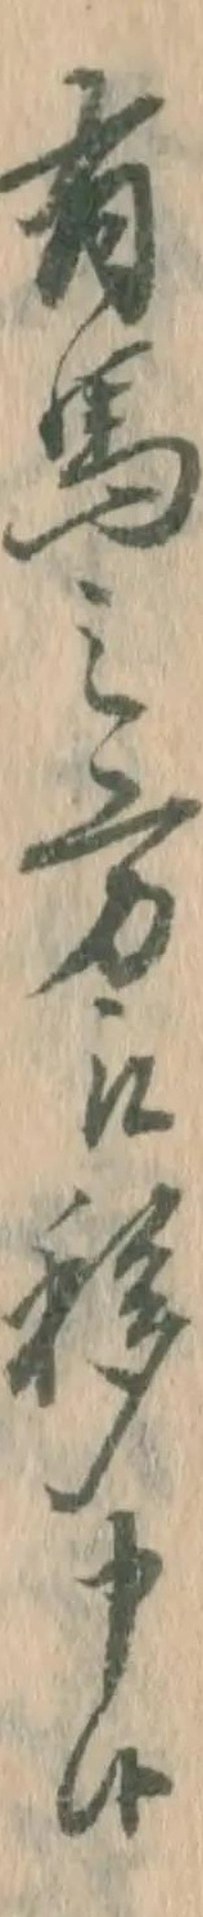有馬之方江移申候
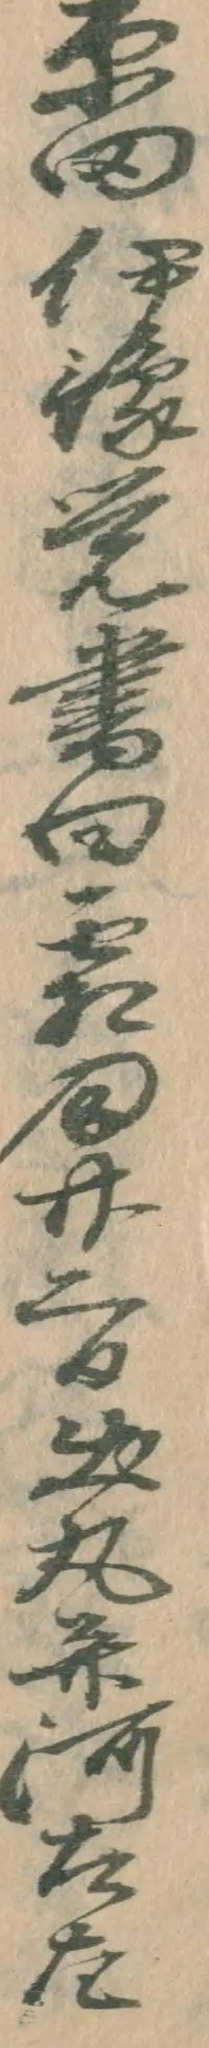原田伊予覚書曰霜月廿二日出丸并河太左
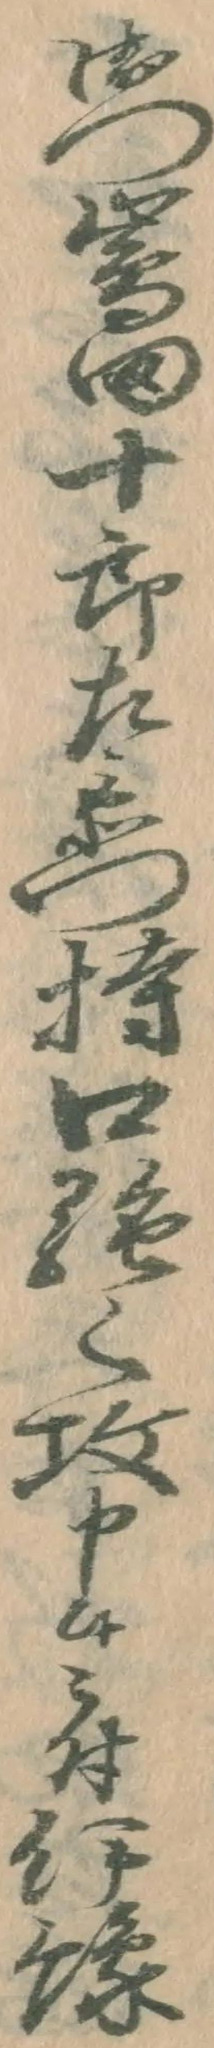衛門島田十郎左衛門持口強く攻申候に付伊予
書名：切支丹御退治記 49巻. [3]
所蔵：国立国会図書館 National Diet Library, JAPAN
